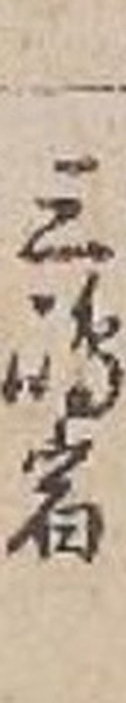三嶋宿
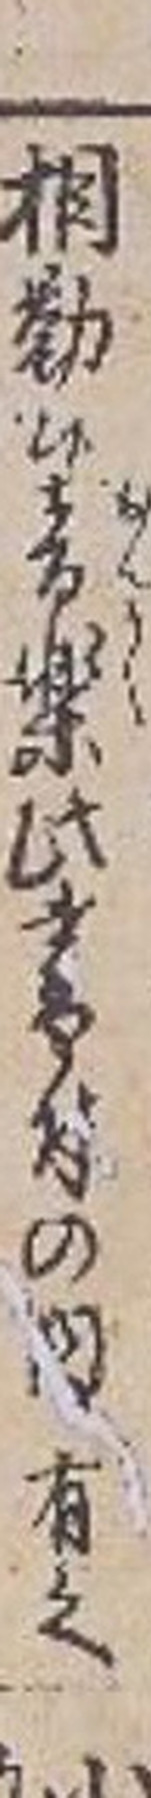相勤候音楽の書付の内有之
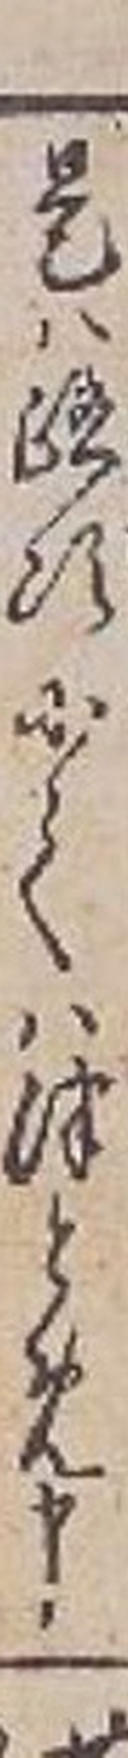是は路次にてはつとめ申
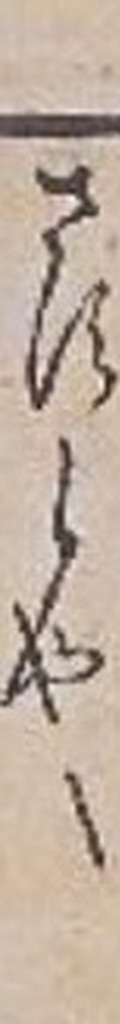さすとや
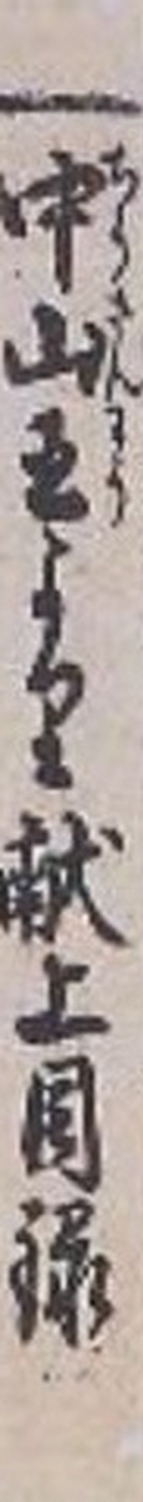中山王より献上目録
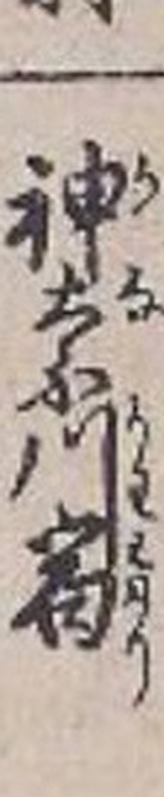神奈川宿
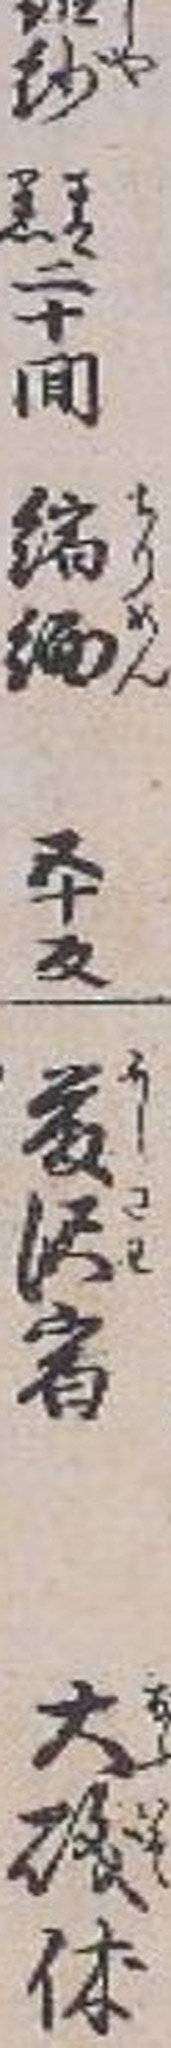藤沢宿大磯休
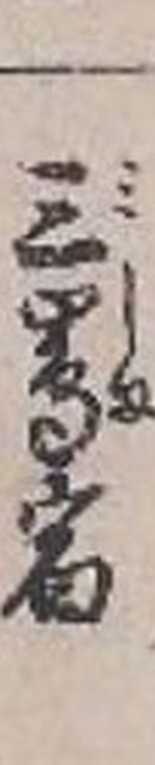三嶋宿
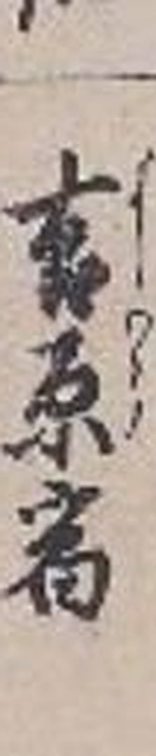吉原宿
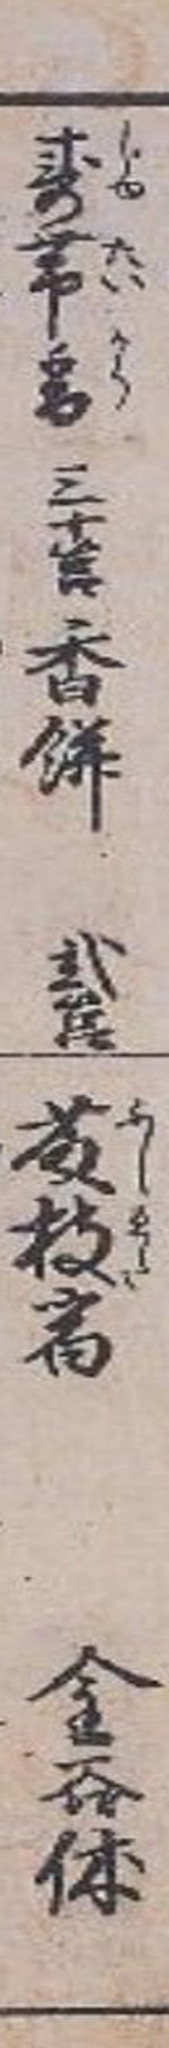寿帯香三十袋香餅弐箱

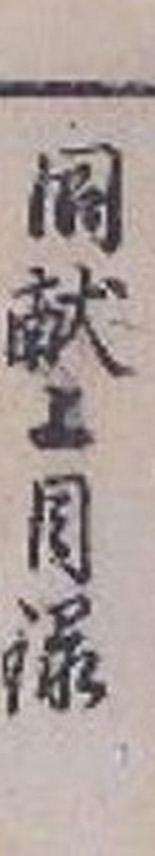同献上目録
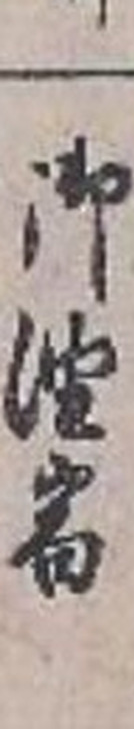御油宿
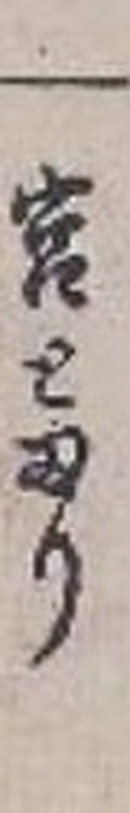宮とまり
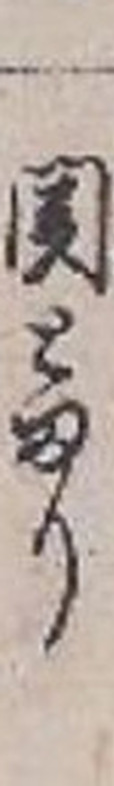関とまり
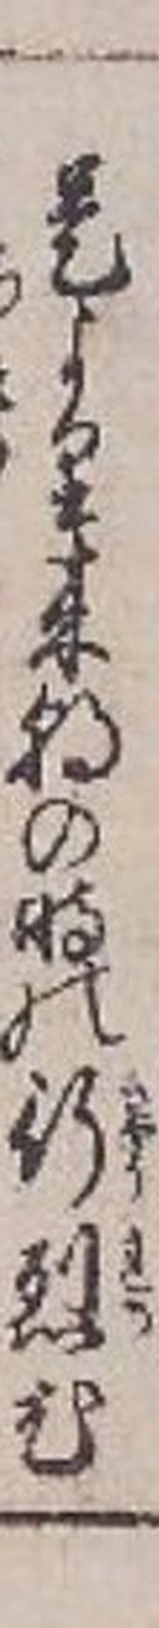是より来朝の時の行烈ひ
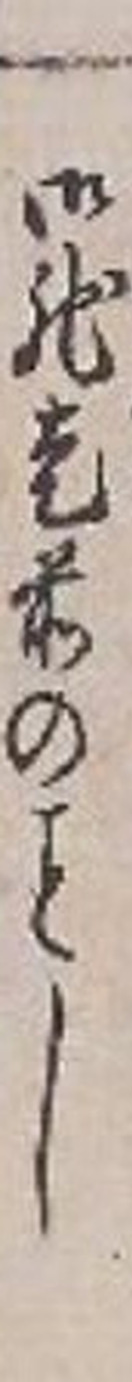御馳走前のことし
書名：琉球人大行列記 来朝新板絵入
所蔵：University of the Ryukyus Library
